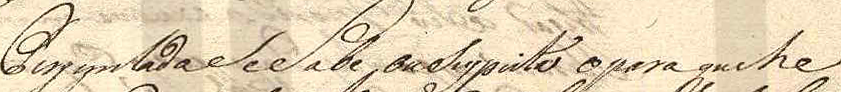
Perguntada se Sabe ou Suspeita o para que he
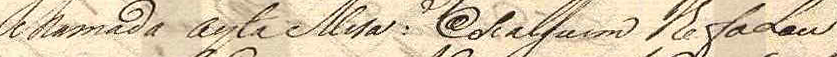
chamada a esta Mesa: e se alguem lhe faLou
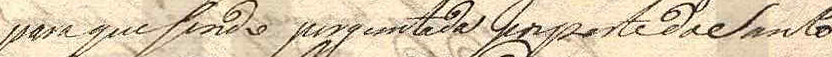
para que sendo perguntada por parte do Santo
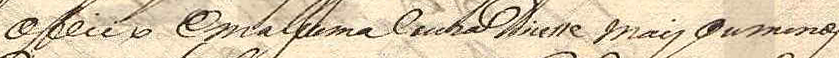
officio em alguma Couza dicesse mais ou menos
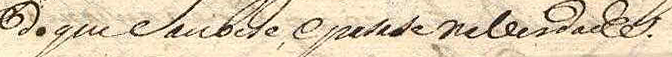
do que Soubesse e pasase na verdade.
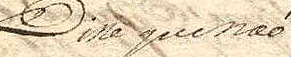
Disse que naõ
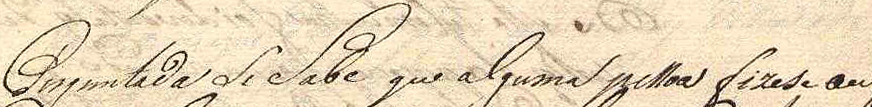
Perguntada se Sabe que alguma pessoa fizese ou
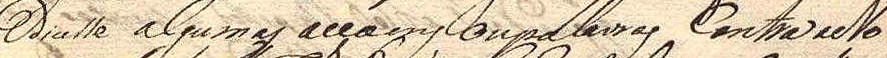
dicesse algumas accoens ou palavras Contra a No
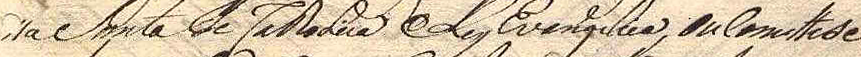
ssa Santa Fe CathoLica e Ley Evangelica, ou Comettese
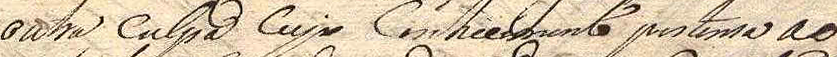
outra Culpa Cujo Conhecimento pertensa ao
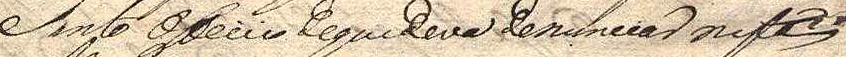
Santo Officio de que deva denunciar nesta
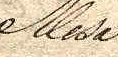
Mesa
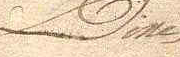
Disse
